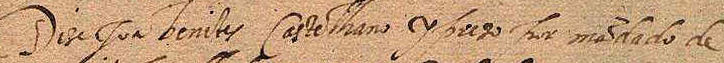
Dise Juā benites Castelhano y prezo por maõdado de
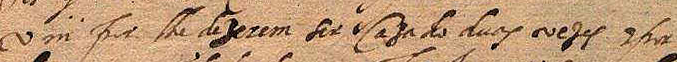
v m por lhe dezerem ser Casado duas vezes E por
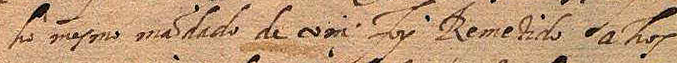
ho mesmo maõdado de v m foy Remetido a hos
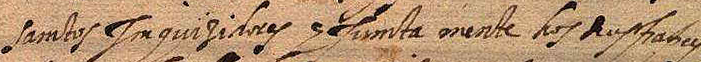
samtos Jmquizidores E Jumtamente hos seus papeis
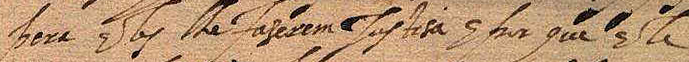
pera Eles lhe fazerem Justisa E porque Ele
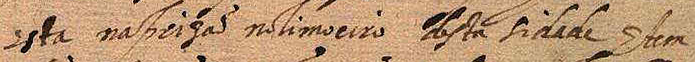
Esta na prizaõ no limoeiro desta sidade E tem
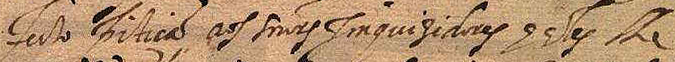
feito pitiçaõ aos snor̄s Jmquizidores E Eles lhe
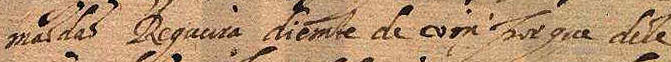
maõdaõ Requeira diemte de v m porque dele
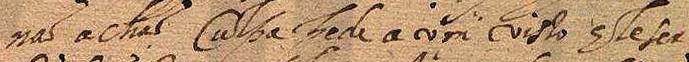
naõ achaõ Culpa pede a v m visto Ele ser
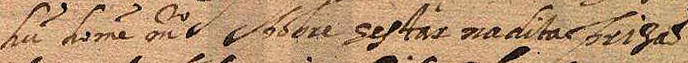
hū homē mto pobre E estar na dita prizaõ
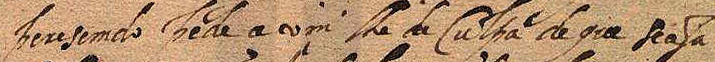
peresemdo pede a v m lhe de Culpa de que se aJa
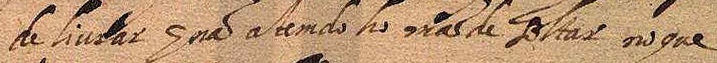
de liurar E naõ a temdo ho maõde soltar no que
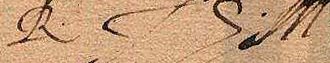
R. J E. M.
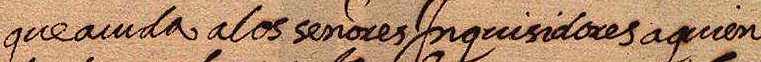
que aiuda a los senōres Jnquisidores a quien
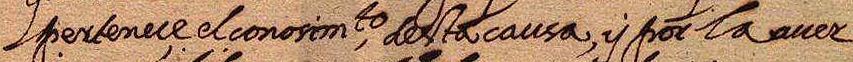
pertenece el conosimto, desta causa, y por la auer
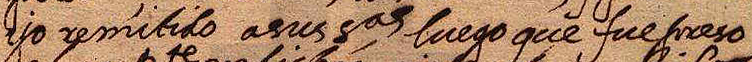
ijo remitido a sus sas, luego que fue preso
